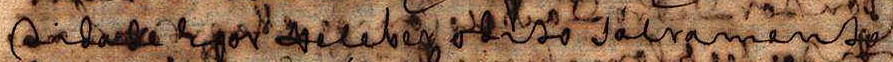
tidade E por Receber o dito sacramento
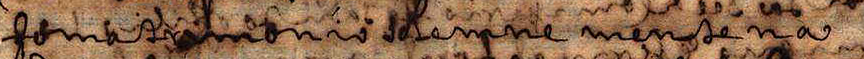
do matrimonio solemnemente na
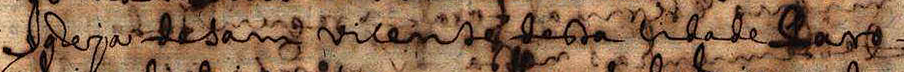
Igreja de sam vicente desta cidade Paro
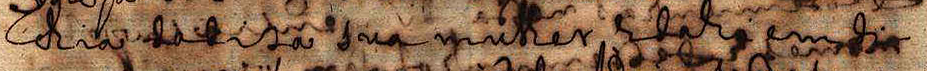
chia da dita sua mulher E dahi em di
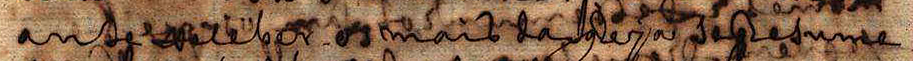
ante Receber os mais da Igreja se presume
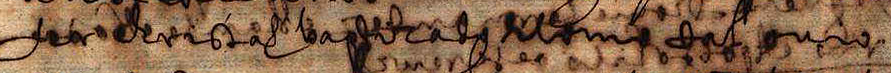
ser christaõ baptizado E como tal o uio
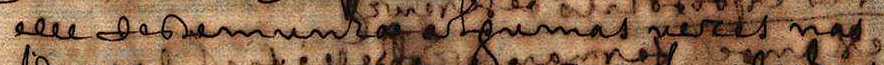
elle testemunha algumas vezes nas
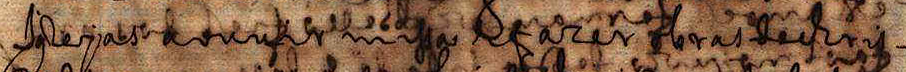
Igrejas ouuindo missa E fazer obras de chris
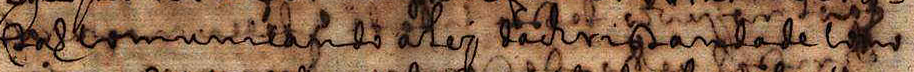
taõ comunicando a lej da christandade como
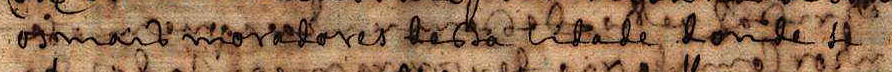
os mais moradores desta cidade donde se
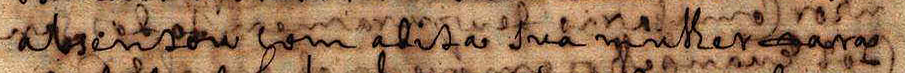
absentou com a dita sua mulher para
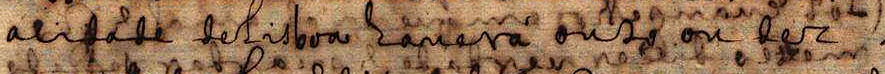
a cidade de Lisboa hauerá outo ou dez
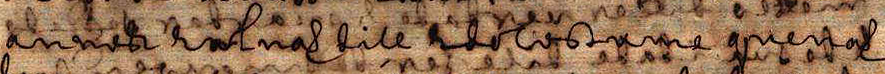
annos E al naõ diçe E do costume que naõ
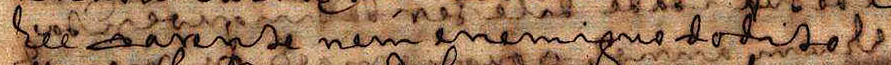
hee parente nem enemiguo do dito
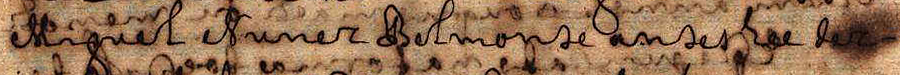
Miguel Nunez Belmonte antes hee dez
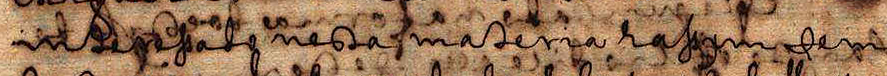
interessado nesta materia E assym tem
